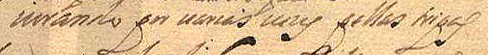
iurando por uarias uezes pellas tripas
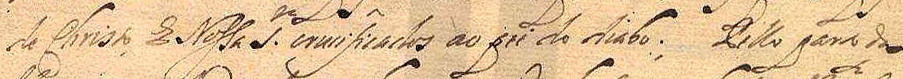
de Christo, E Nossa S.ra crusificados ao pee do diabo; Pello parto da
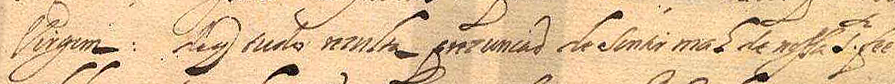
Virgem: de q̄ tudo rezulta prezunçaõ de sentir mal de nossa s.ta fee
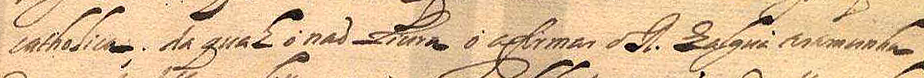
catholica, da qual o naõ Liura o afirmar o R. E alguā testemunha
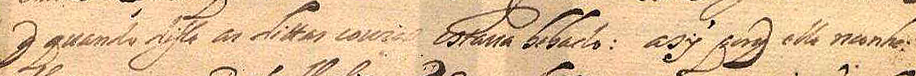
q̄ quando disse as dittas couzas estaua bebado: asy porq̄ elle reconhe
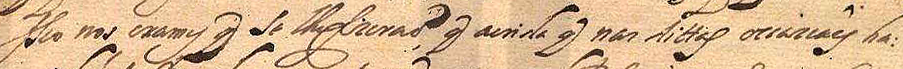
sseo nos exames q̄ se lhe fizeraõ, q̄ ainda q̄ nas dittas occazioẽs ha
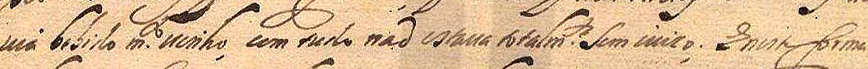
uia bebido m.to uinho, comtudo naõ estaua totalm.te sem iuizo; E nesta forma
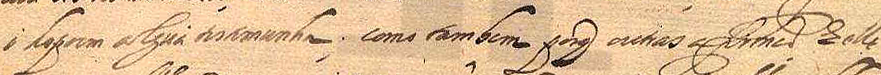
o depoem alguā testemunha; como tambem porq̄ outras afirmaõ E elle
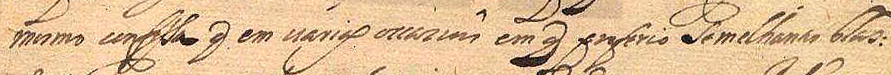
mesmo confessa q̄ em uarias occazioĩs em q̄ preferio semelhantes blas
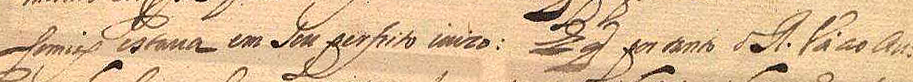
femias estaua em seu perfeito iuizo: E q̄ portanto o R. Vá ao au
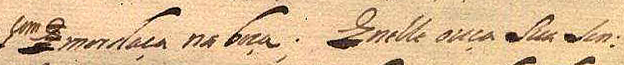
com _ mordaça na boca; E nelle ouça sua sen
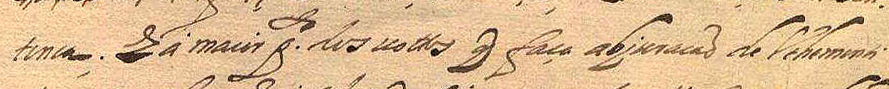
tenca; E a maior p.te dos uottos q̄ faça abjuraçaõ de Vehementi
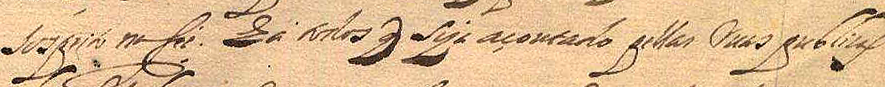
sospeito na fee; E a todos q̄ seja açoutado pellas ruas publicas
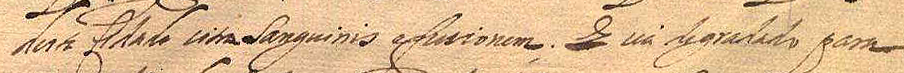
desta Cidade citra sanguinis efusionem; E uá degradado para
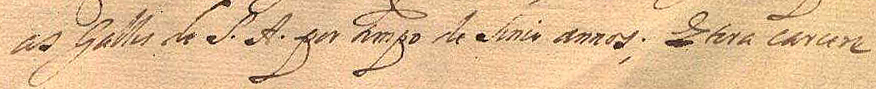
as Galles de S. A. por tempo de sinco annos; E tera carcere
